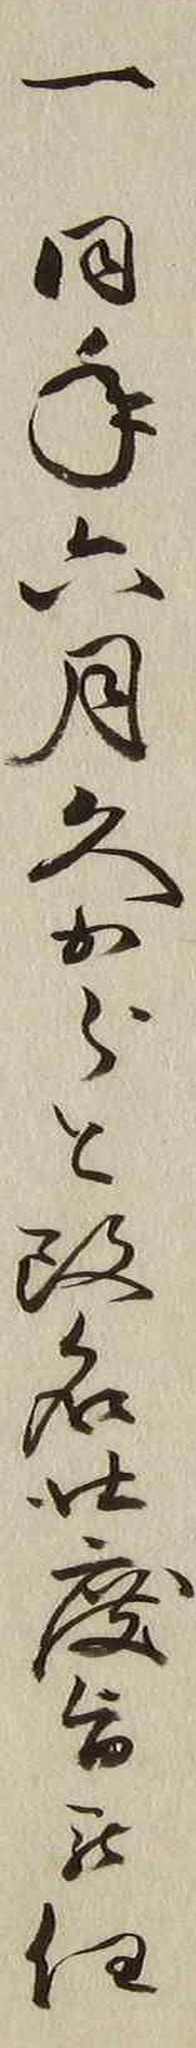一同年六月久五郎と改名仕度旨被任
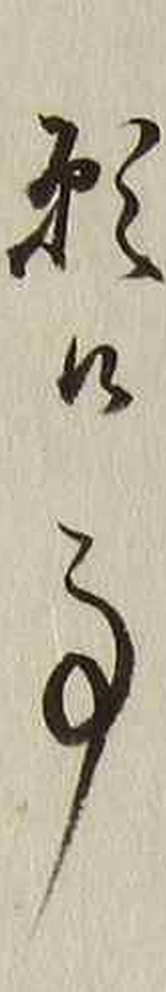願候事
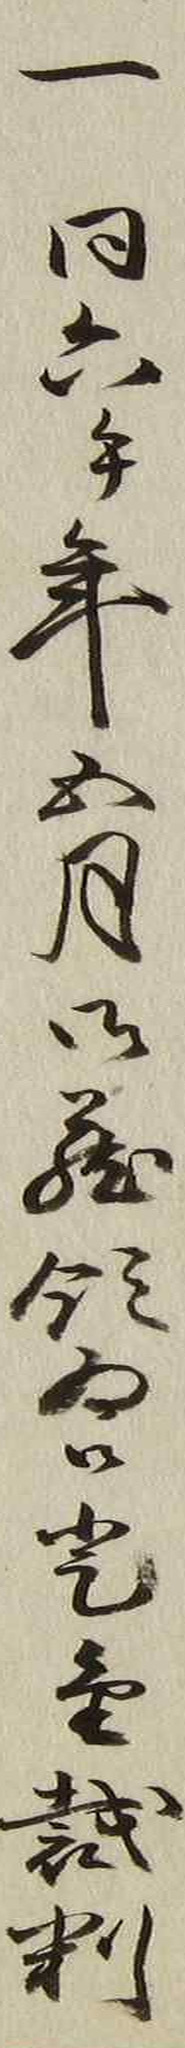一同六午年五月御蔵領為御登金裁判
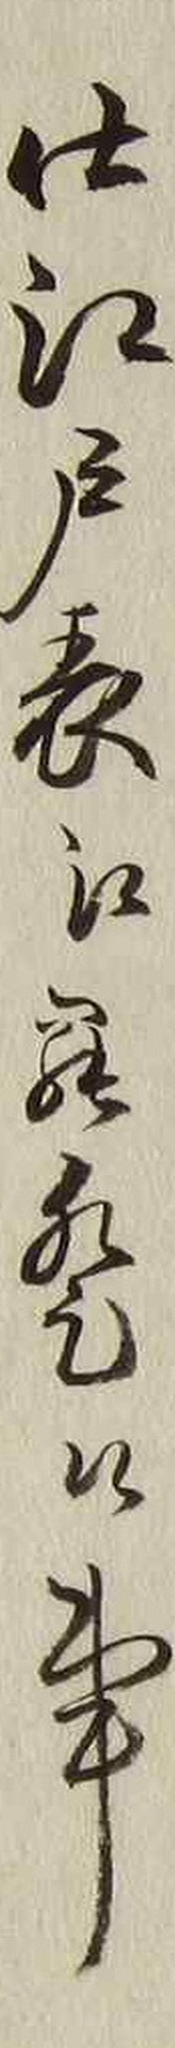仕江戸表江罷登候事
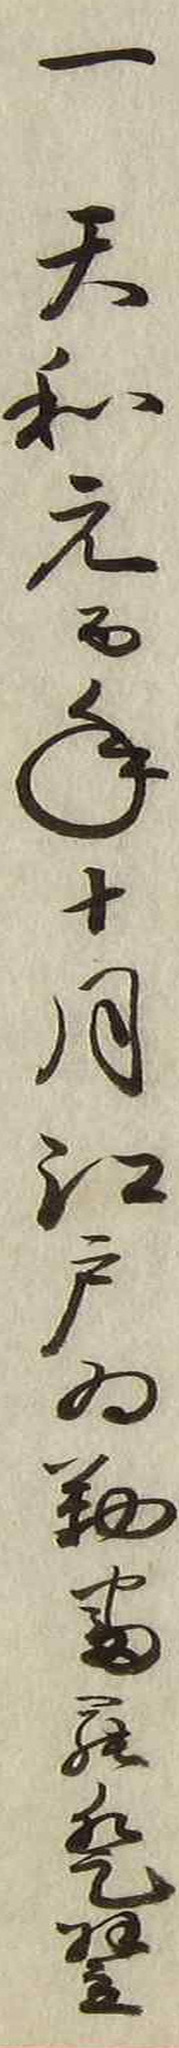一天和元酉年十月江戸為勤番罷登翌
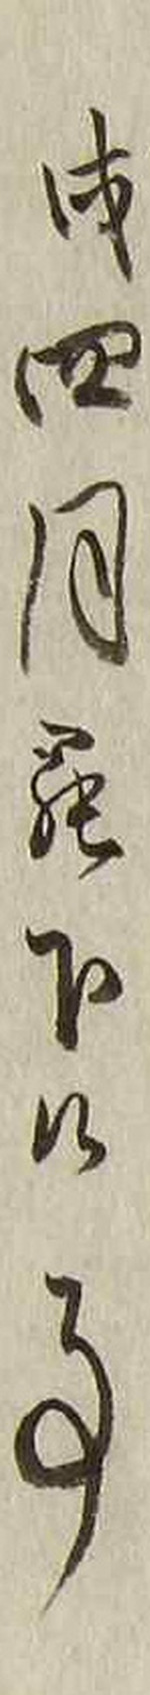戌四月罷下候事
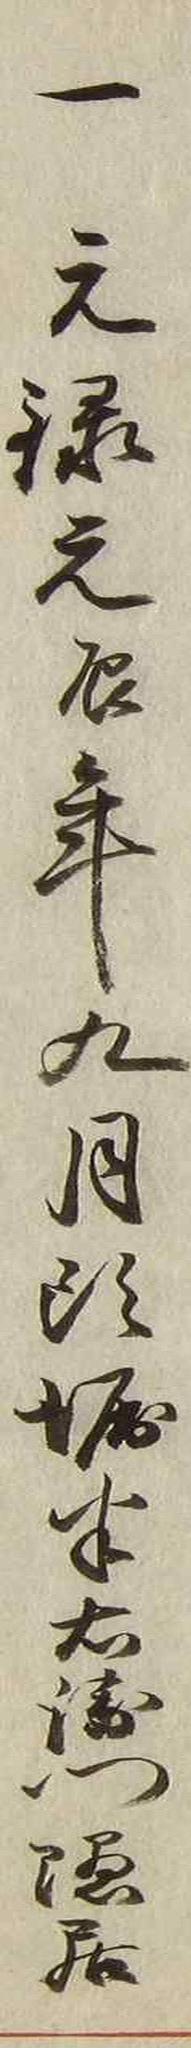一元録元辰年九月頭堀半右衛門隠居

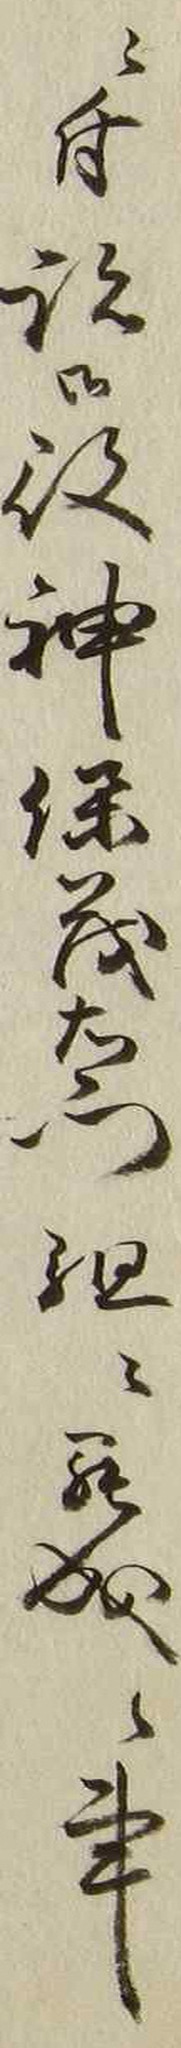ニ付跡御役神保茂右エ門組ニ罷成候事
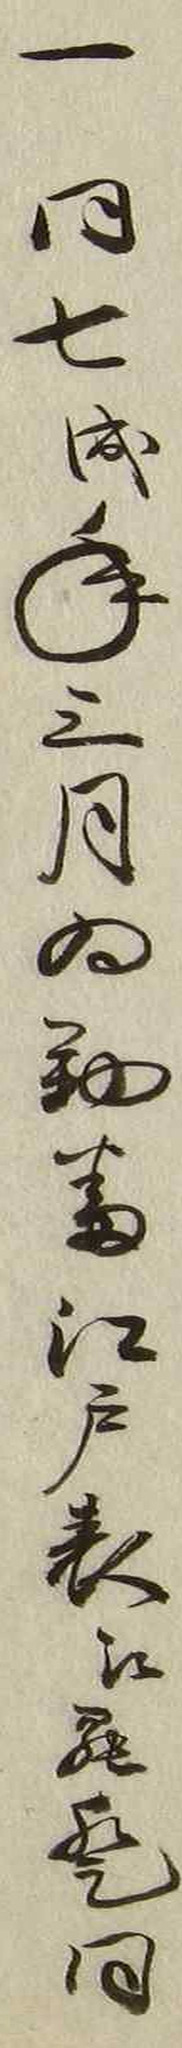一同七戌年三月為勤番江戸表江罷登同
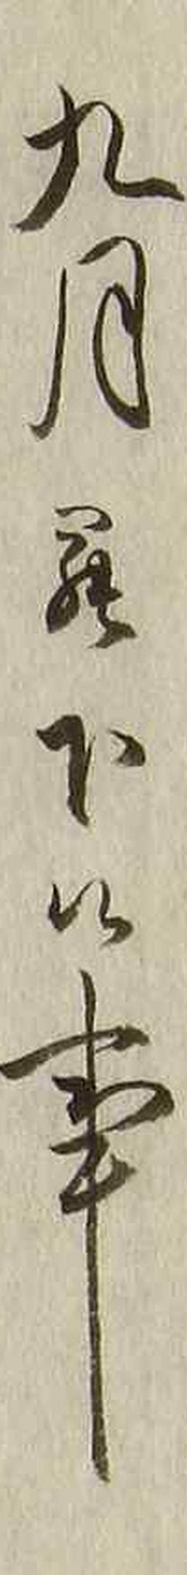九月罷下候事
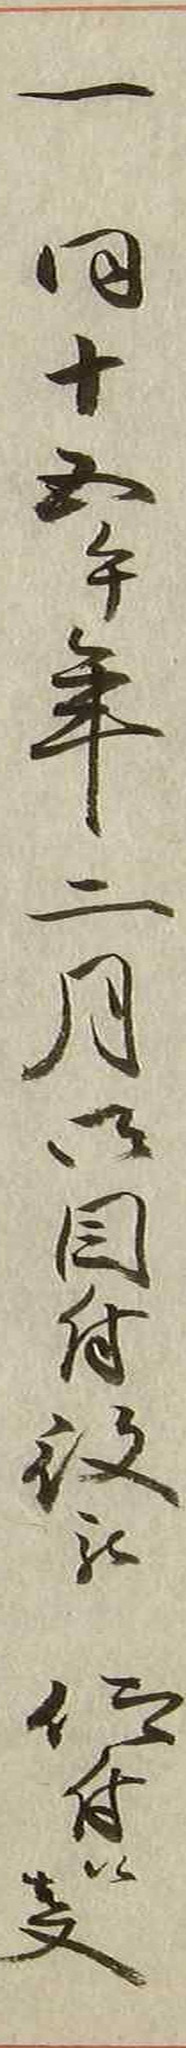一同十五午年二月御目付役被仰付候事
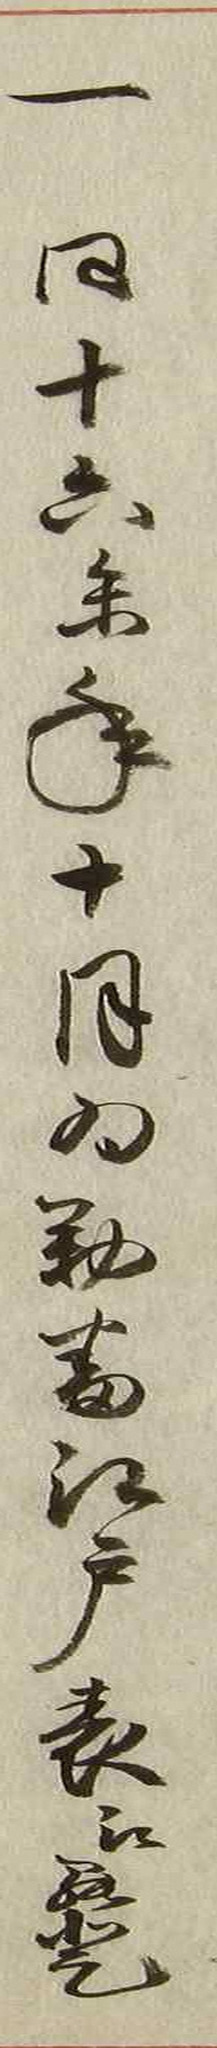一同十六未年十月為勤番江戸表江罷登
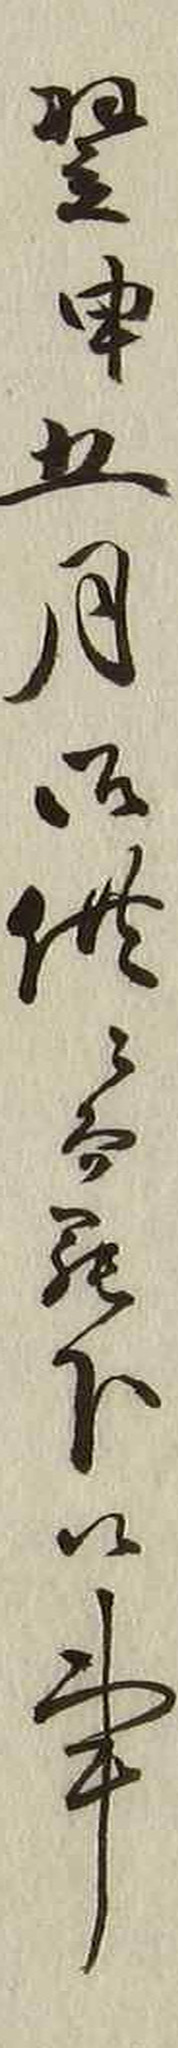翌申五月御供ニ而罷下候事
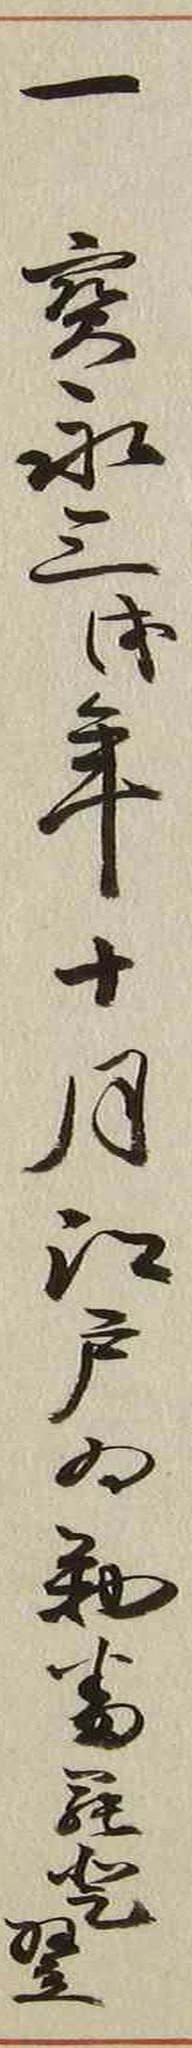一宝永三戌年十月江戸為勤番罷登翌
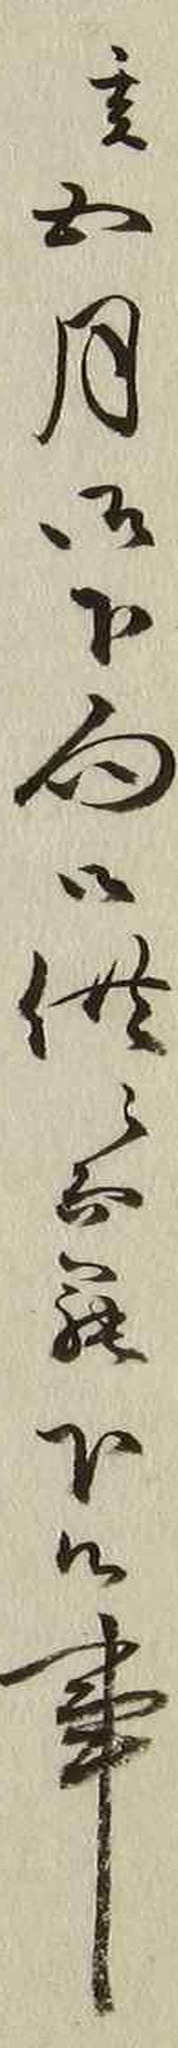亥五月御下向御供ニ而罷下候事
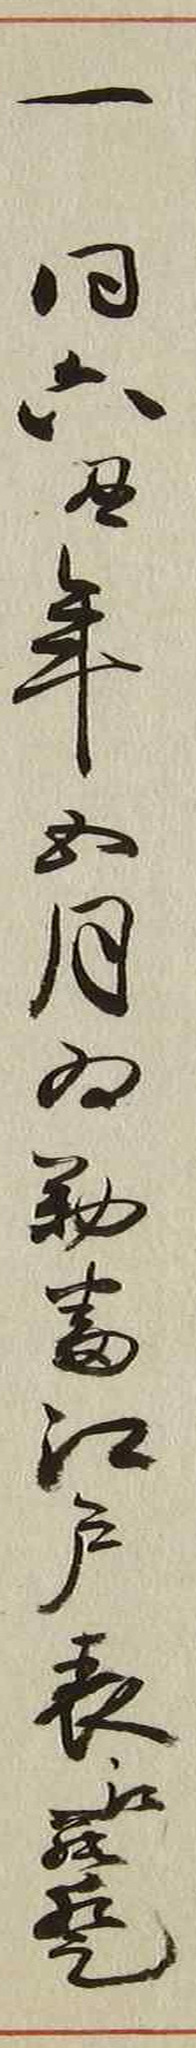一同六丑年五月為勤番江戸表江罷登
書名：諸士系譜　巻之15　い之部15
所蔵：会津若松市立会津図書館
